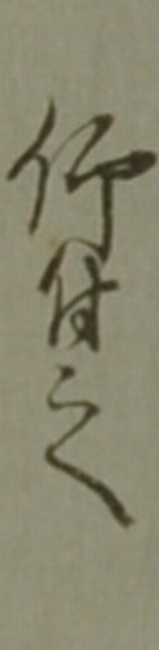仰付之
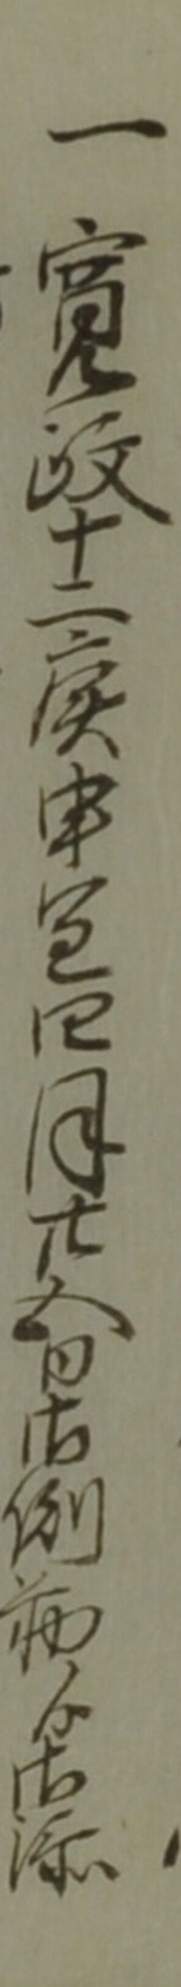一寛政十二庚申閏四月廿五日御側勤より御添
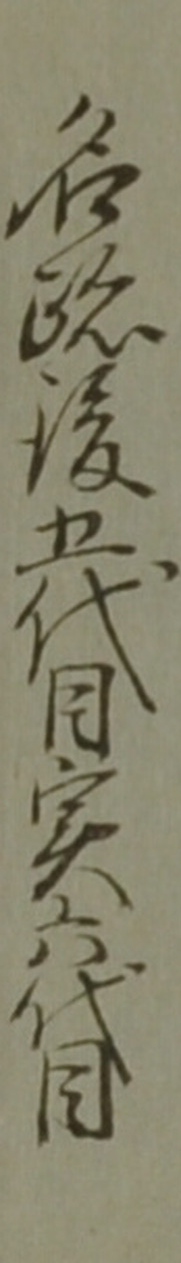名跡後五代目実六代目
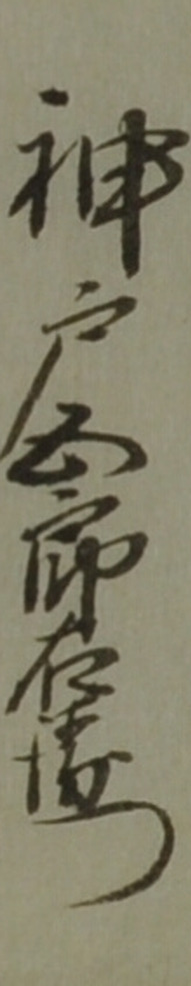神戸五郎右衛門
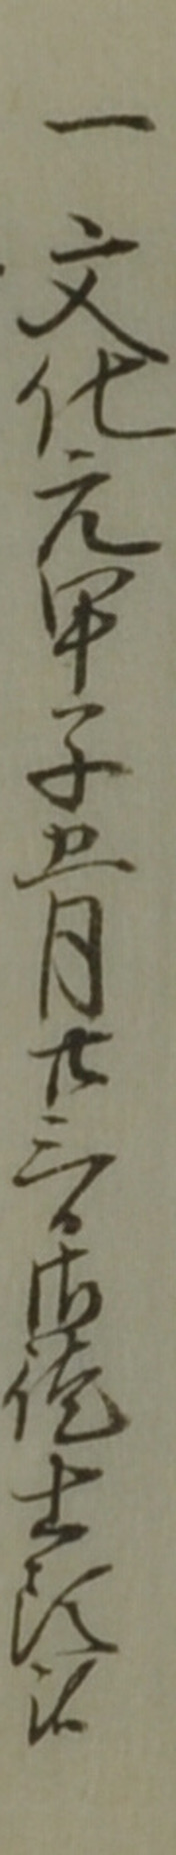一文化元甲子五月廿三日御徒士頭被
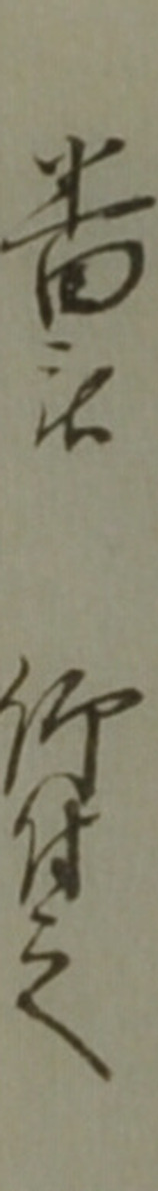番被仰付之
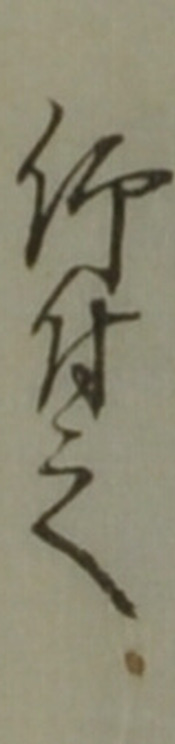仰付之
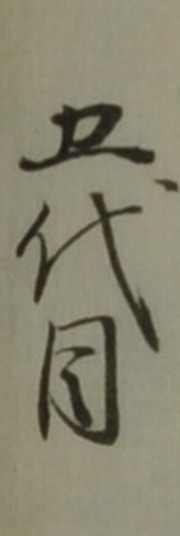五代目
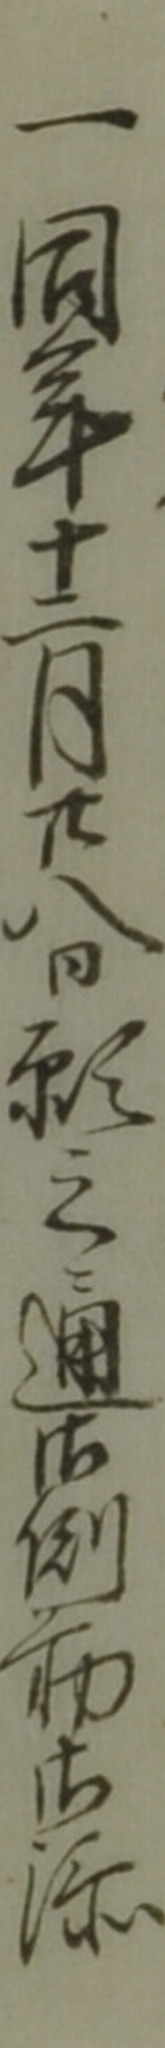一同年十二月廿八日願之通御側勤御添
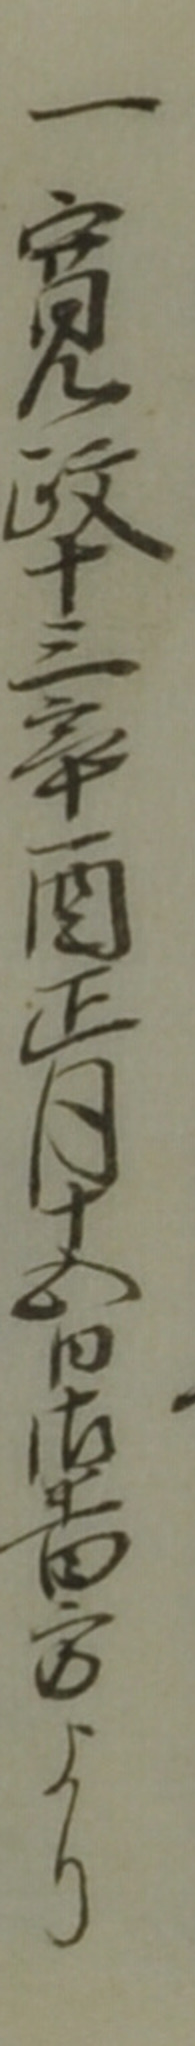一寛政十三辛酉正月十五日御番方より
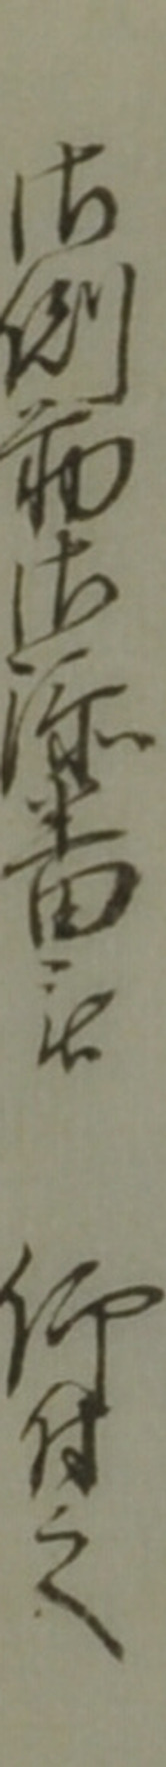御側勤御添番被仰付之
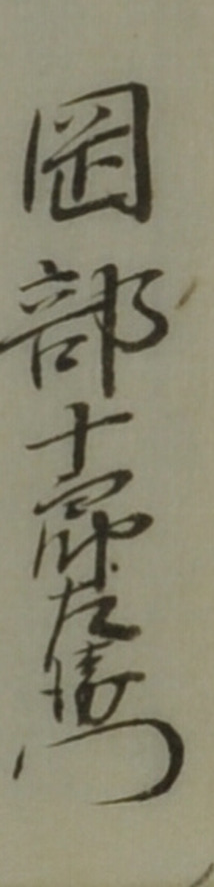岡部十郎左衛門
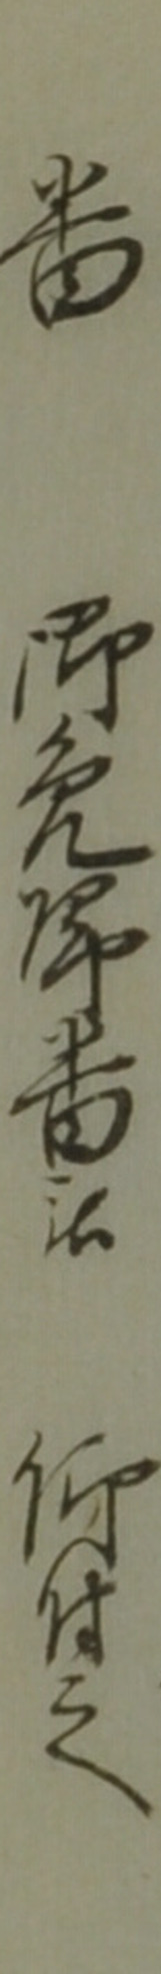番御免席番被仰付之
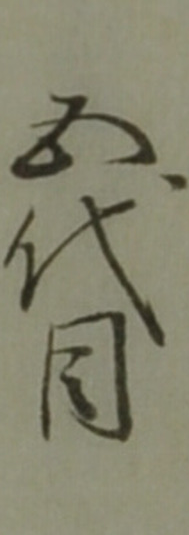五代目
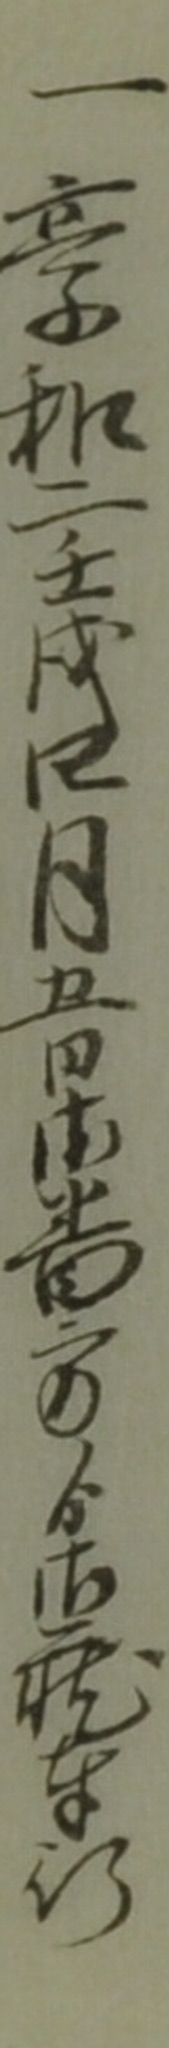一享和二壬戌四月五日御番方より御蔵奉行
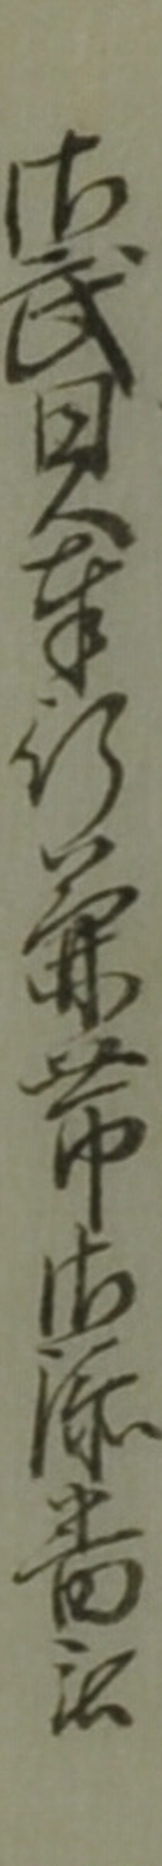御武具奉行兼帯御添番被
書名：諸御役代々録（八）
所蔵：伊那市立高遠町図書館・合同会社AMANE
